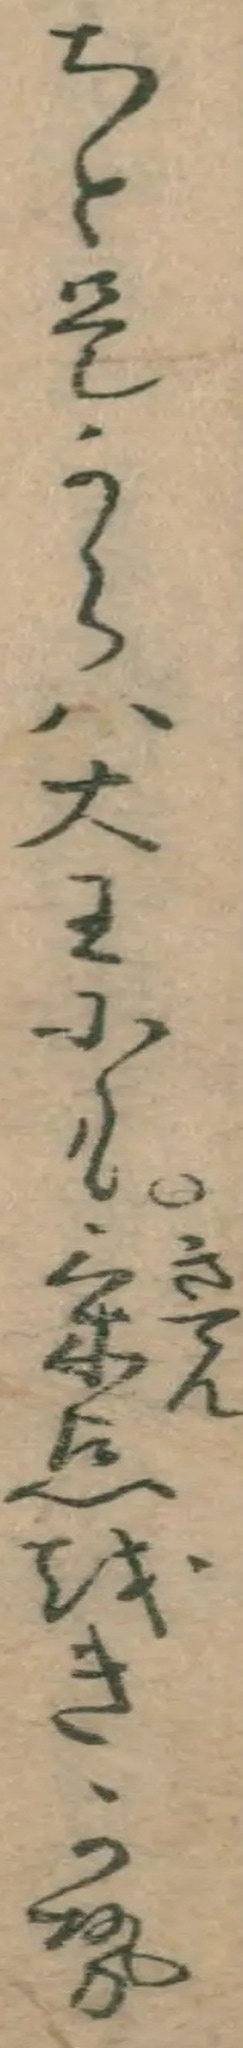ちと是からは大王にも。気点をきかせ
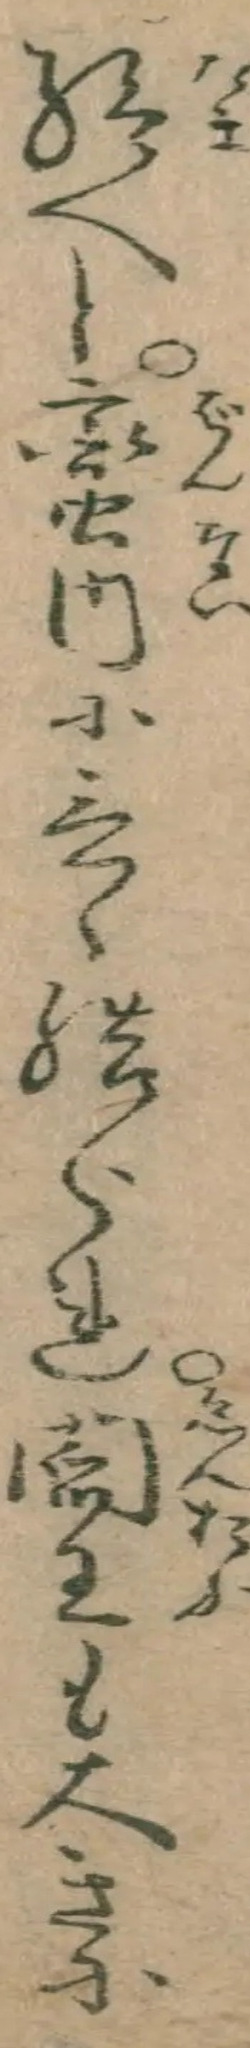給へと。蛮内に言ゝ結られ。閻王も大きに
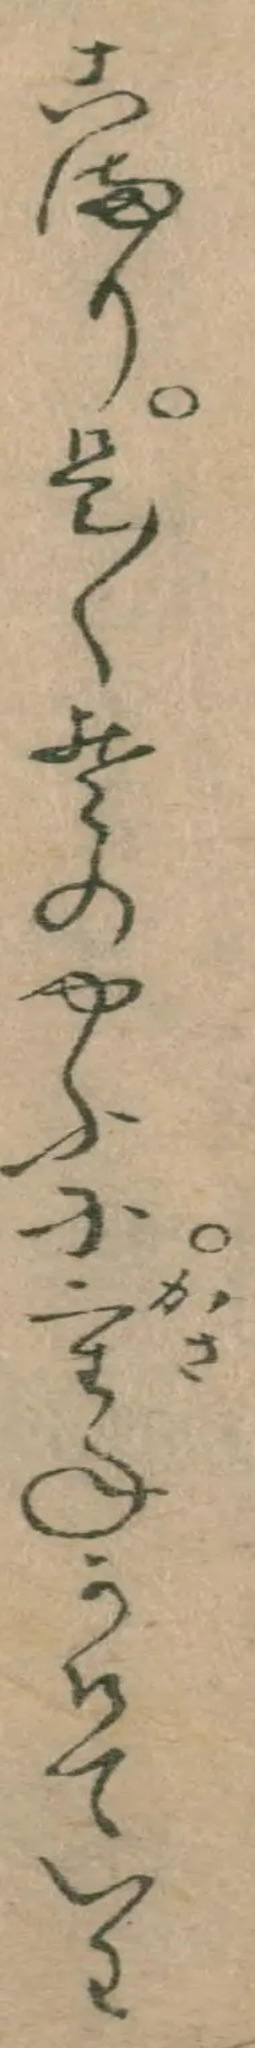こまり。是〳〵そのやふに。重ねかけていわ
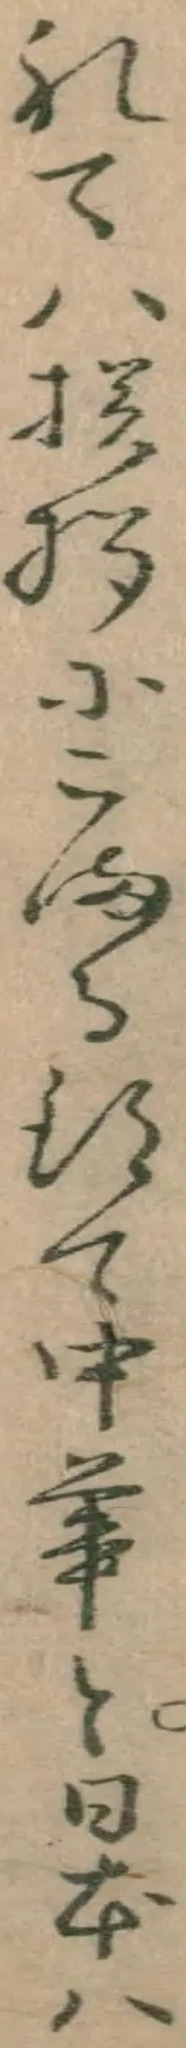れては。挨拶にこまる得て中華と。日本は
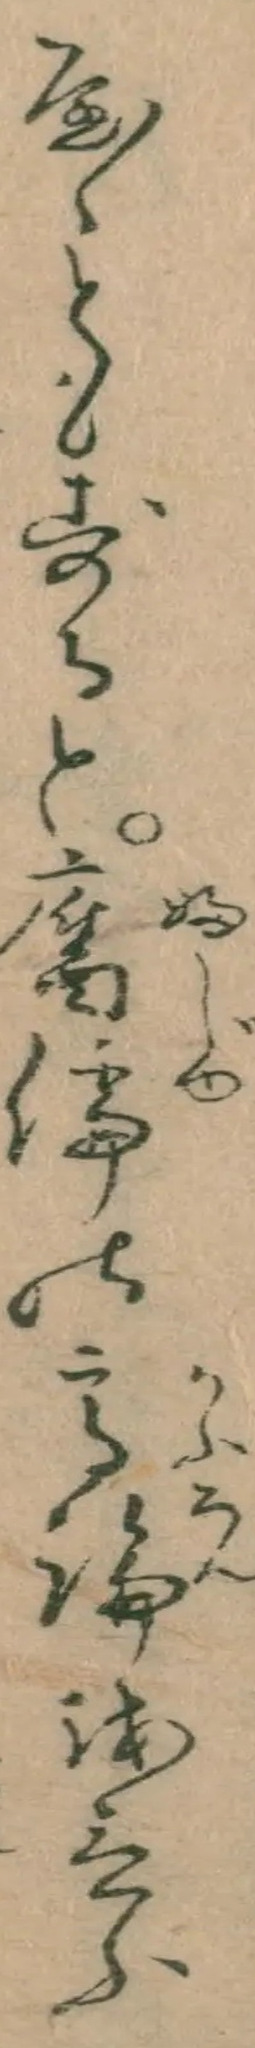やゝともすると。腐儒の高論を言ふ
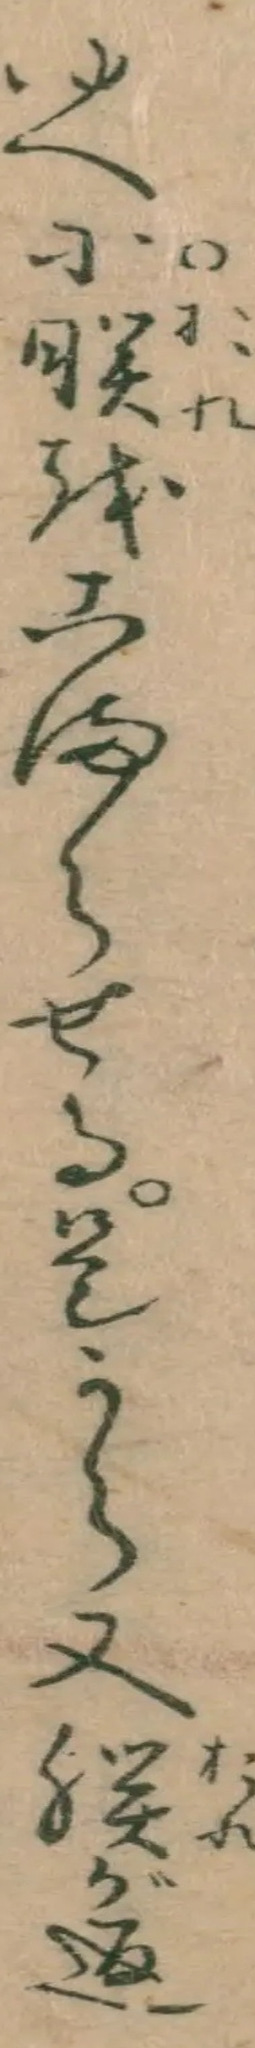ゆへに。朕をこまらせる。是から又朕が返
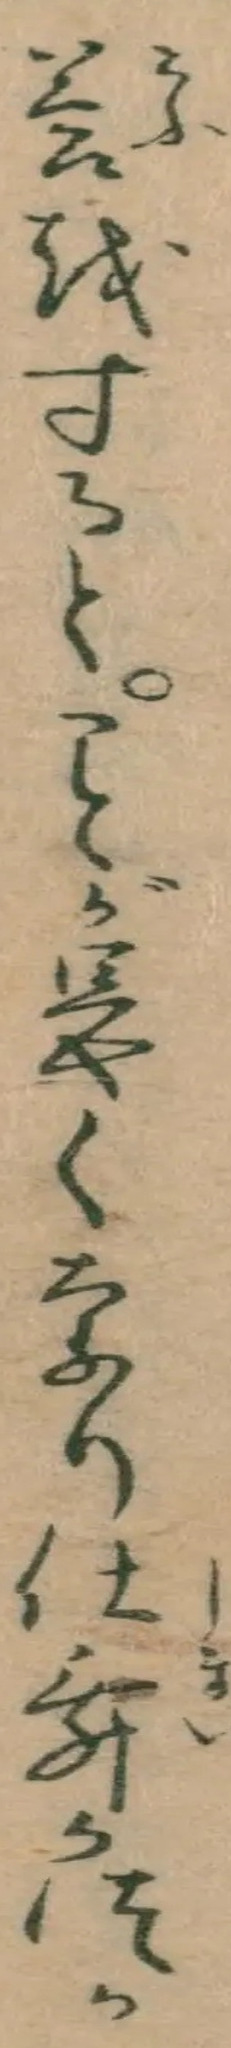答をすると。ことが長くなり仕舞かつか
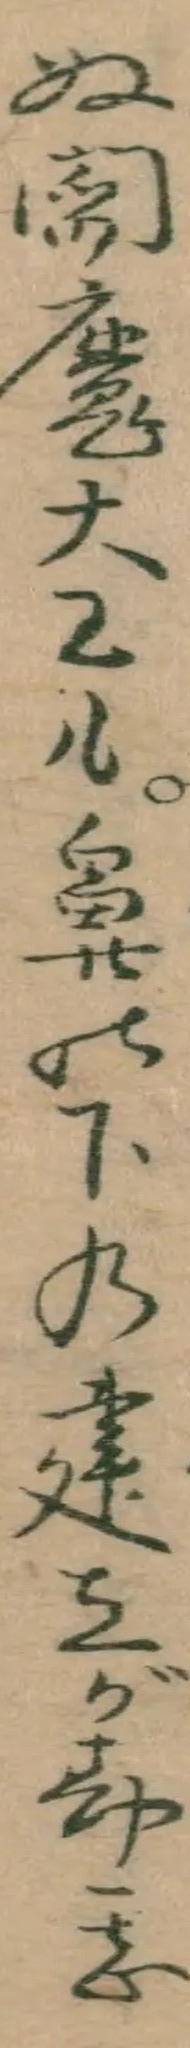ぬ。閻魔大王も。鼻の下の建立が勘甚。
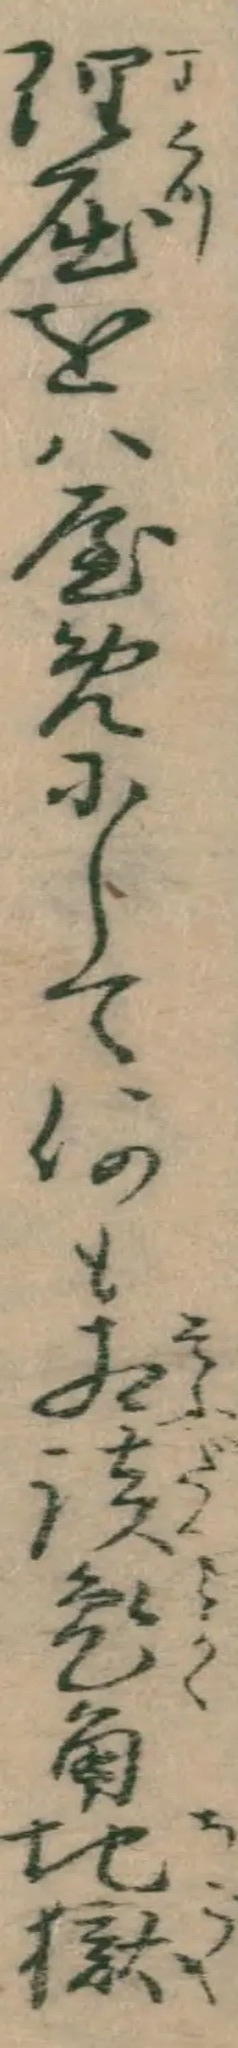理屈をはやめにして何も相談兎角地獄
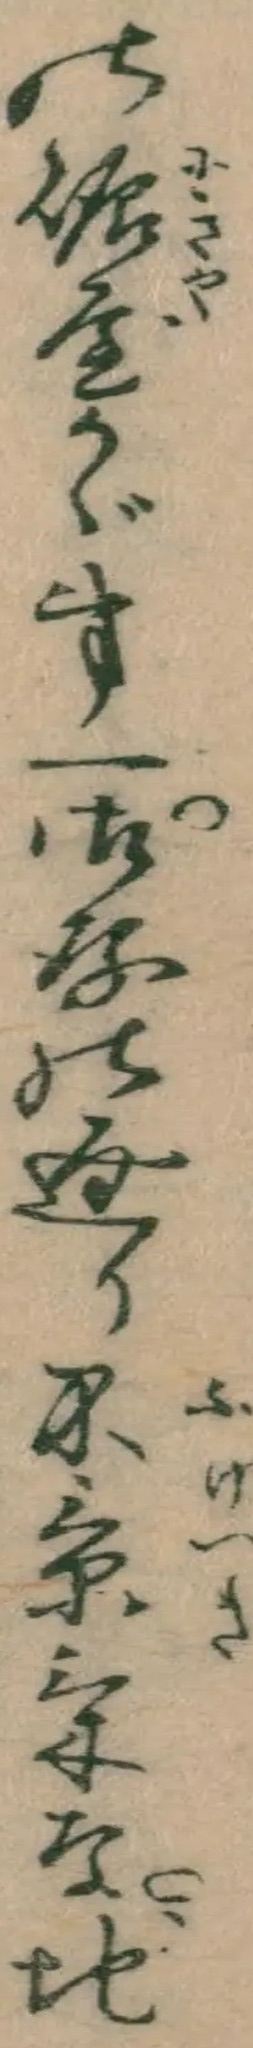の賑やかゞ第一。御存の通り不景気な。地
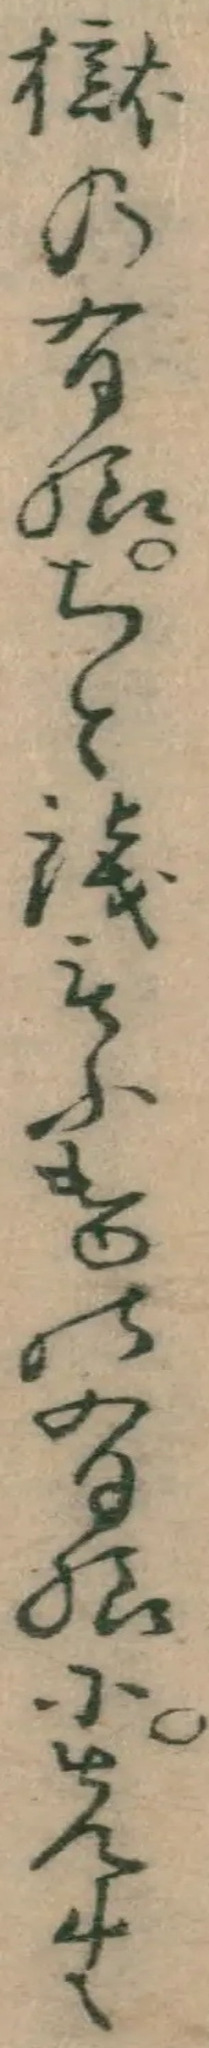獄の有様。ちと銭もふけの有様に。先生
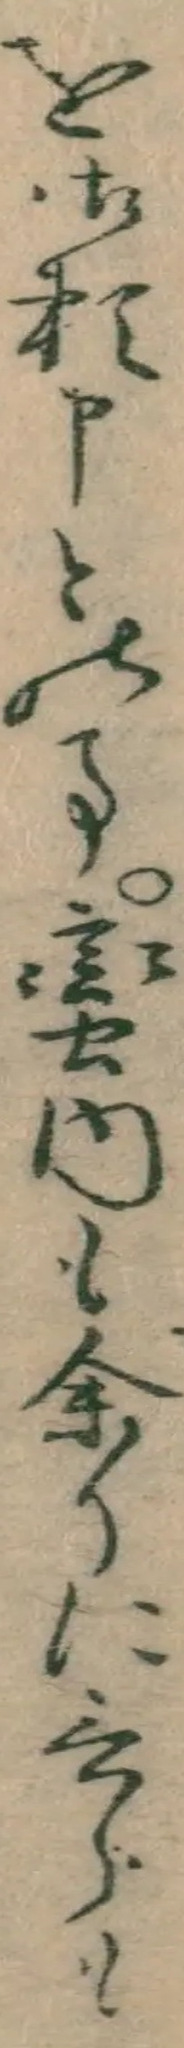を御頼申との事。蛮内も余りに言うも
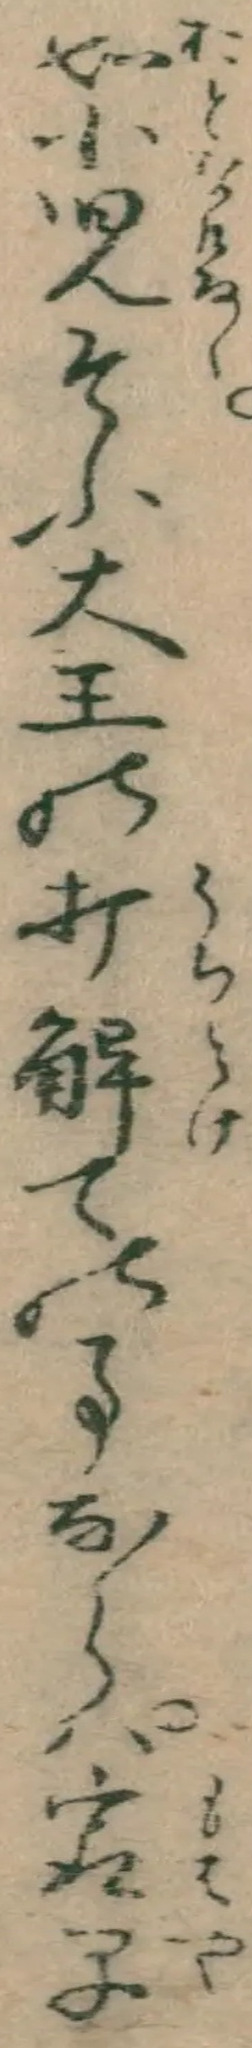如小児。そふ大王の打解ての事ならは。最早
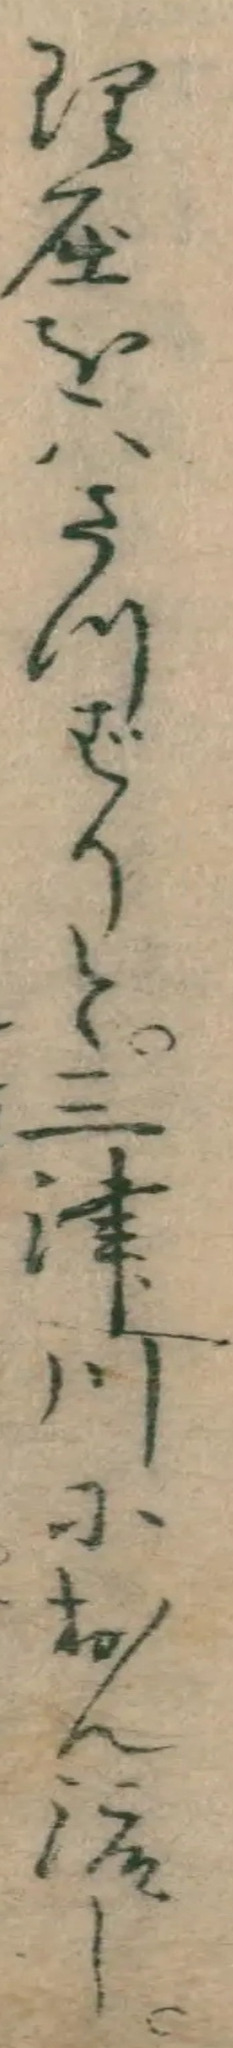即座をはさつばりと。三津川におん流し。
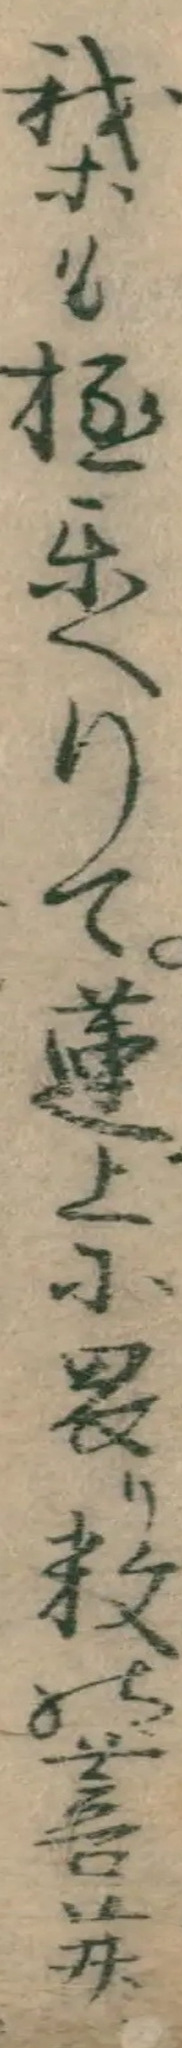我等も極楽へ行て。蓮上に畏り。数の菩薩
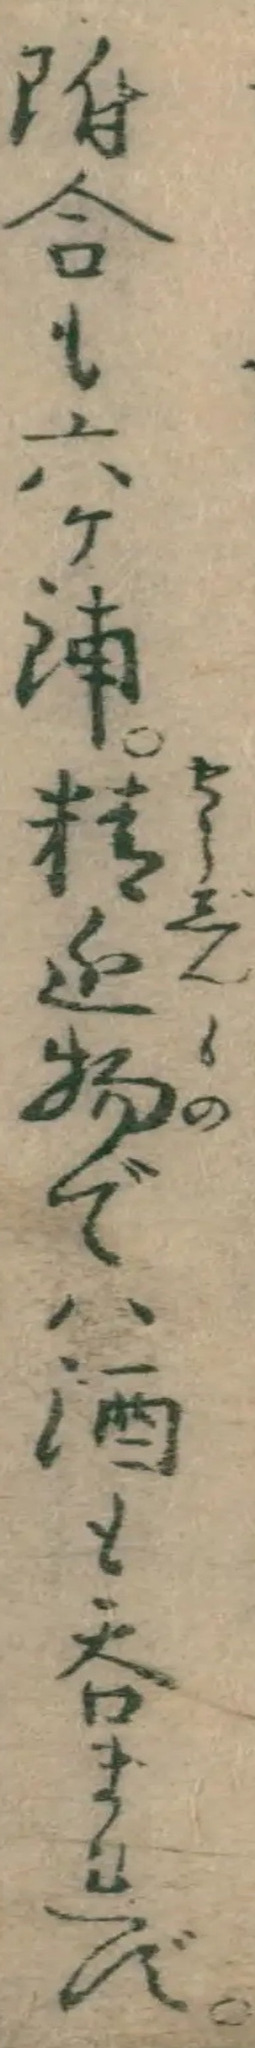付合も六ヵ鋪。精進物では酒も呑まれず。
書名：翻草盲目
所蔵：国立国会図書館 National Diet Library, JAPAN
